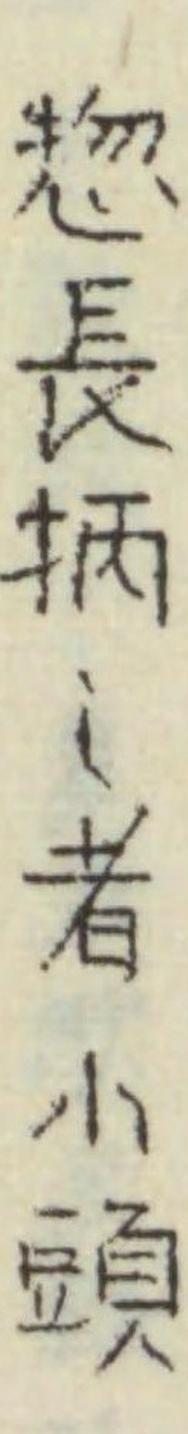惣長柄之者小頭
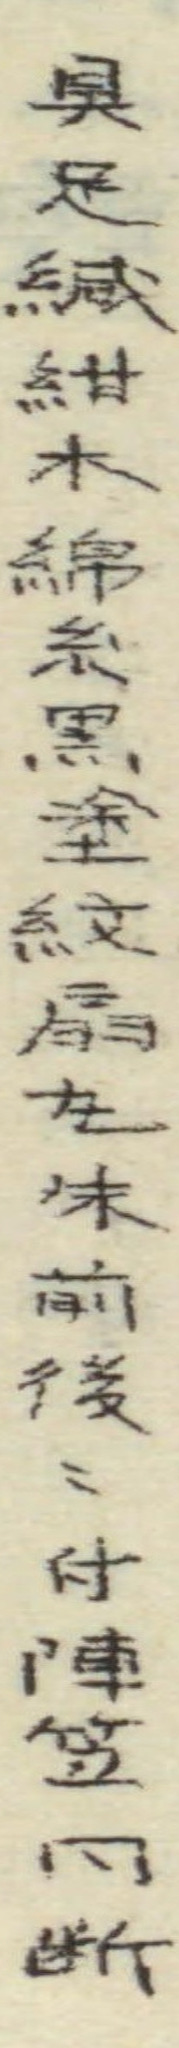具足縅紺木綿糸黒塗紋扇丸朱前後二付陣笠同断
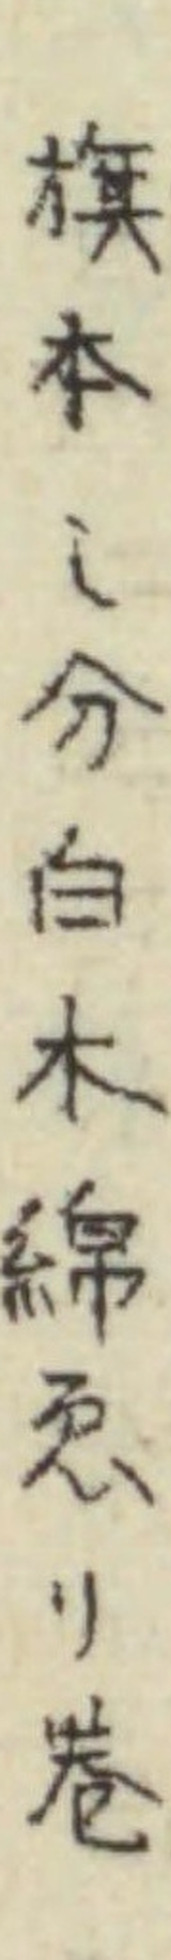旗本之分白木綿ゑり巻
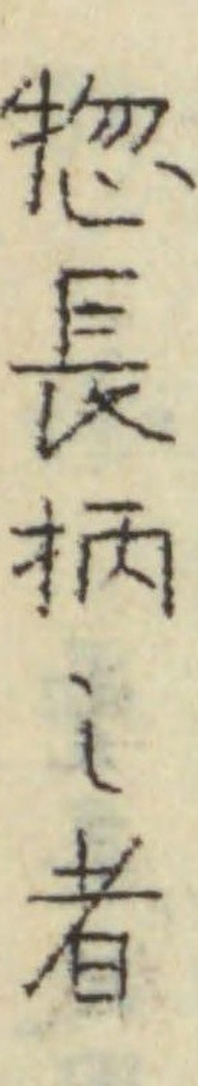惣長柄之者

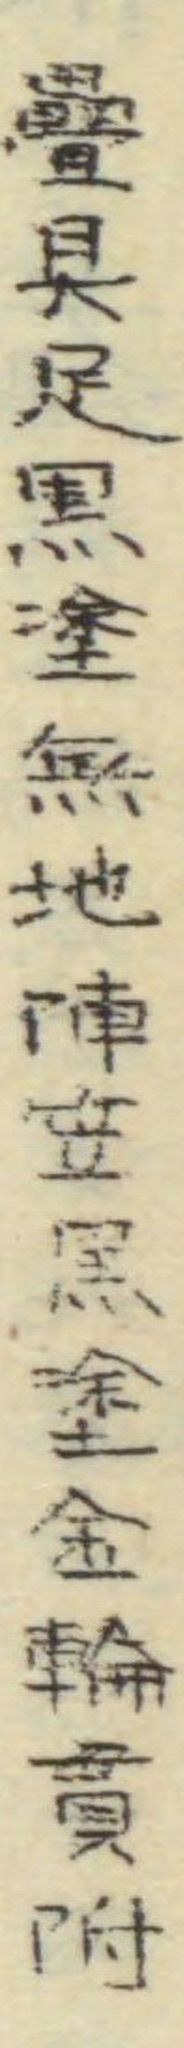畳具足黒塗無地陣笠黒塗金輪貫附
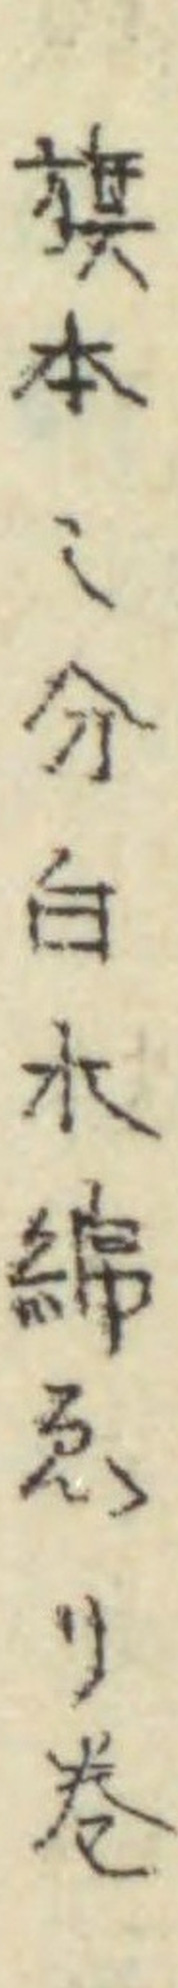旗本之分白木綿ゑり巻
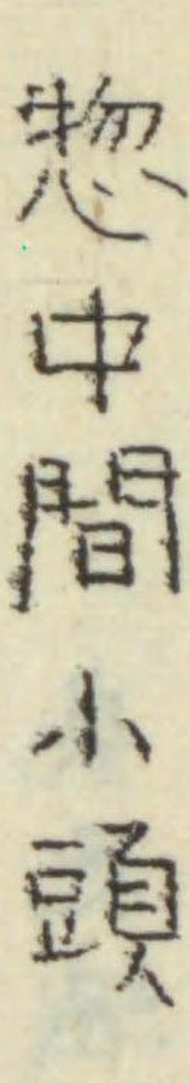惣中間小頭
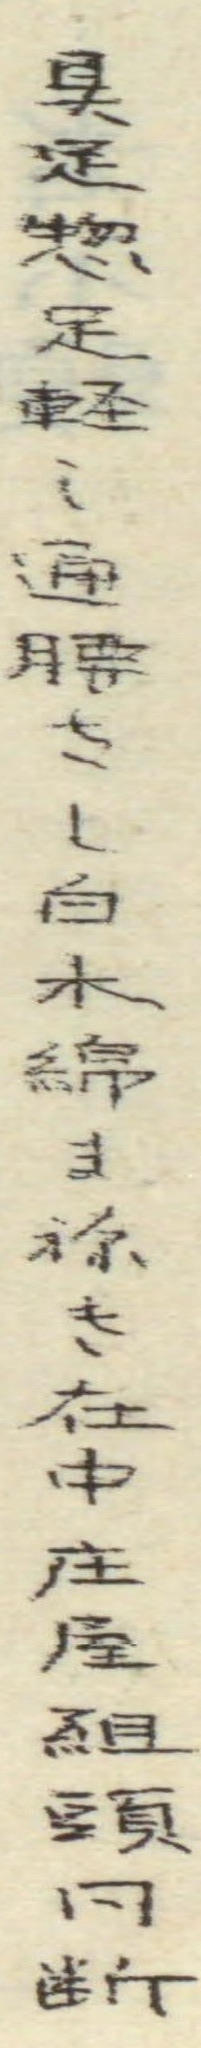具足惣足軽之通腰さし白木綿まねき在中庄屋組頭同断
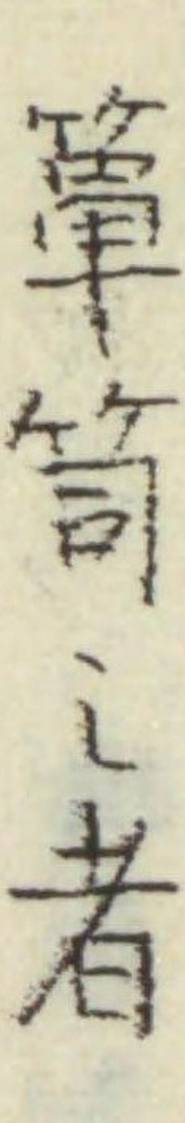箪笥之者
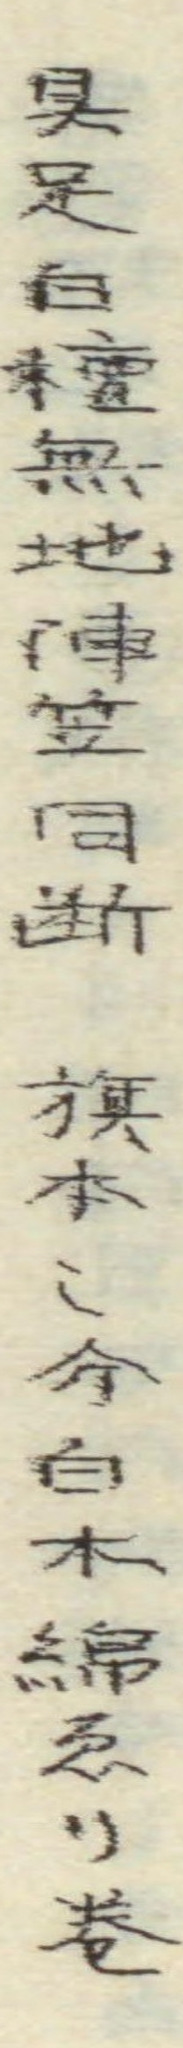具足白種無地陣笠同断旗本之分白木綿ゑり巻
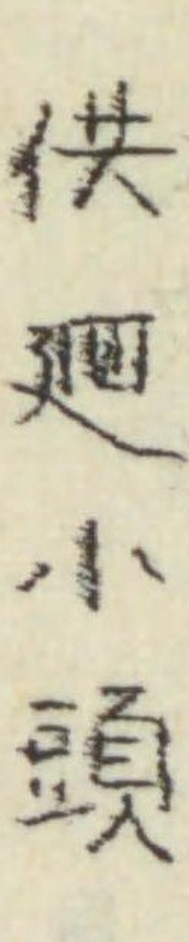供廻小頭
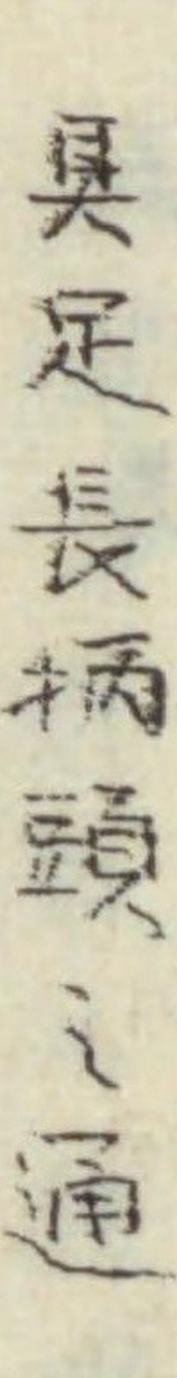具足長柄頭之通
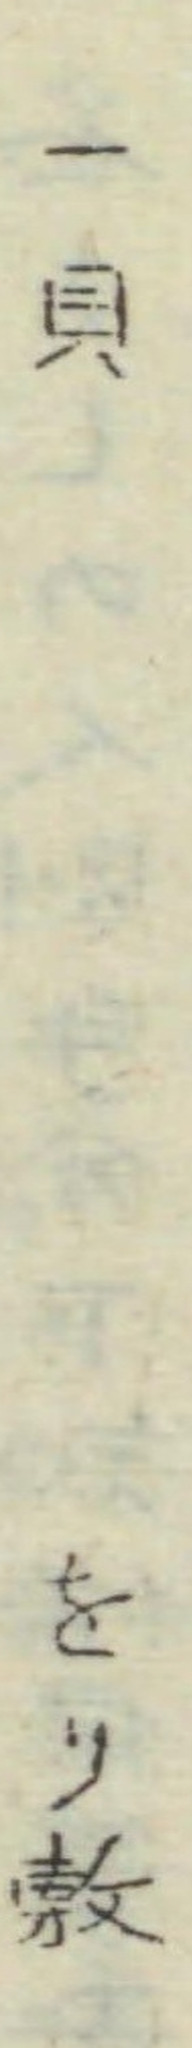一貝をり敷
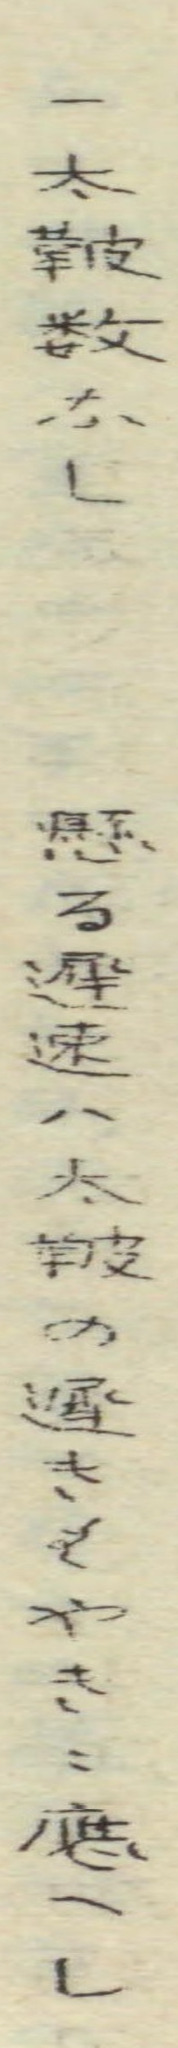一太鞁数なし懸る遅速ハ太鞁の遅きはやき二応へし
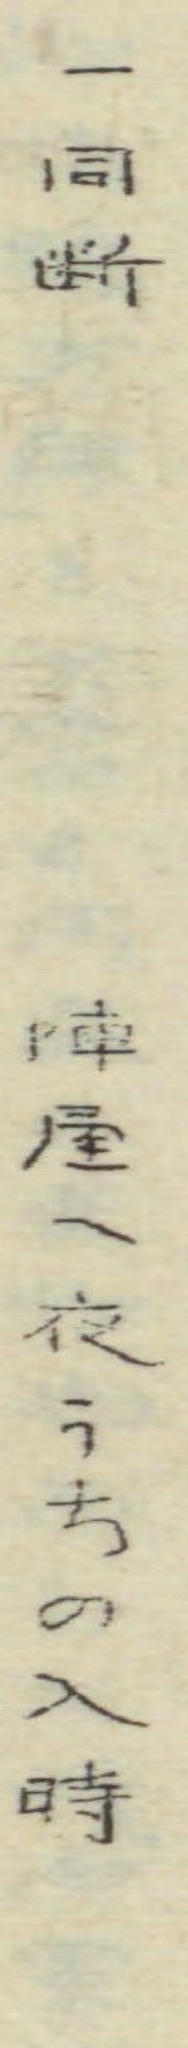一同断陣屋へ夜うちの入時
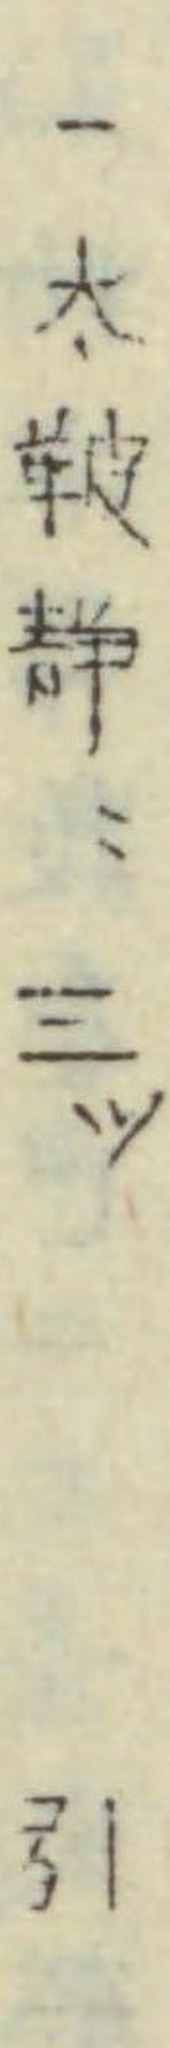一太鞁静二三ッ引
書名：三河吉田藩動員史料
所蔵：国立国会図書館 National Diet Library, JAPAN
